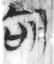含（今）
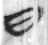日
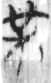某
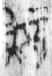𨟻（將）
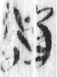欲
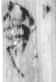○（食）
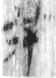某
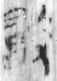敢
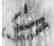㠯（以）
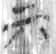亓（其）
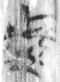妻
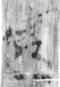妻
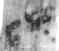女（汝）
